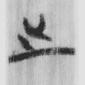之
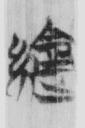{糸宀帝止}
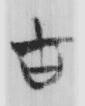古
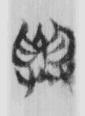與
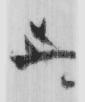之
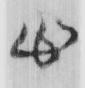心
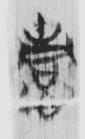情
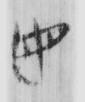母
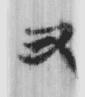又
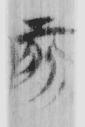所
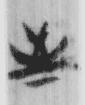至
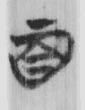百
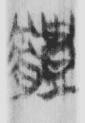體
